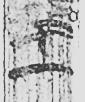王
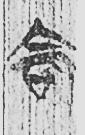命
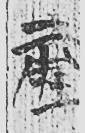坪
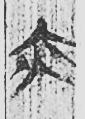亦
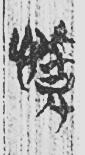悼
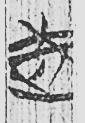武
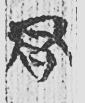君
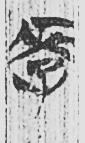李
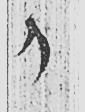人
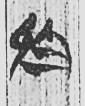於
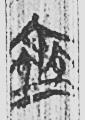齊
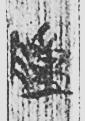陳
